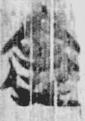表
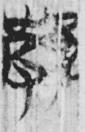○（皮）
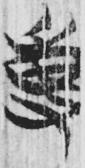尃
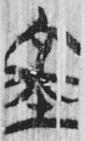○（禹）
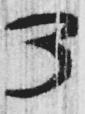乃
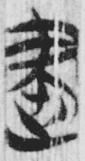○（建）
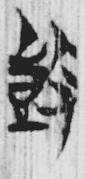○（鼓）
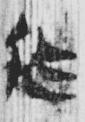於
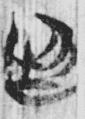廷
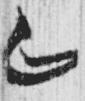㠯（以）
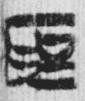爲
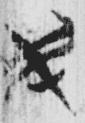民
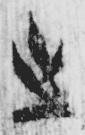之
